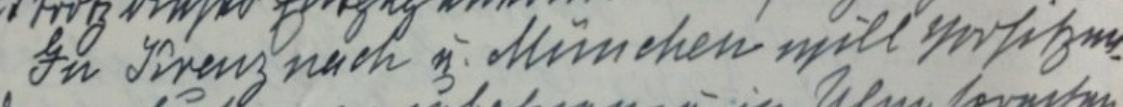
In Kreuznach u. München will Vorsitzen
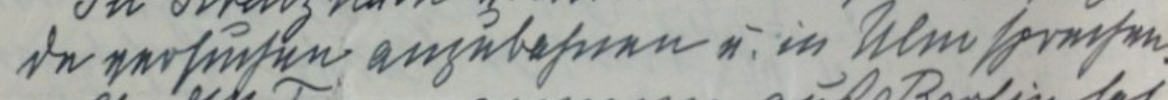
de versuchen anzubahnen u. in Ulm sprechen.
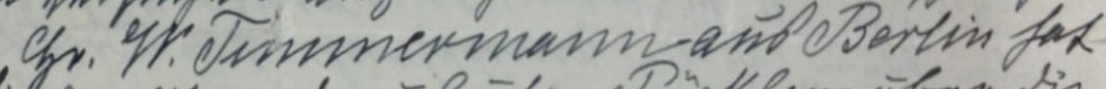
Gr. W. Timmermann aus Berlin hat
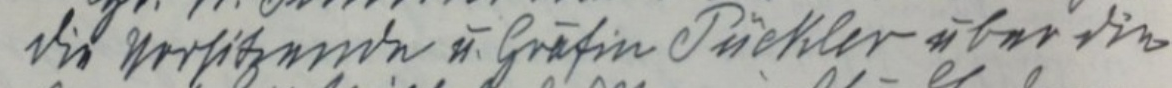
die Vorsitzende u. Gräfin Pückler über die
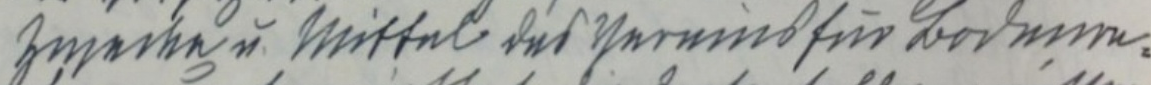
Zwecke u. Mittel des Vereins für Bodenre
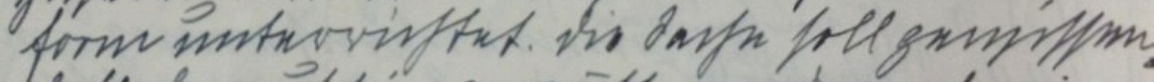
form unterrichtet die Sache soll gewissen
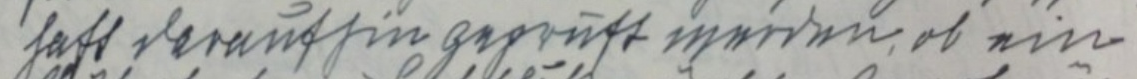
haft daraufhin geprüft werden ob ein
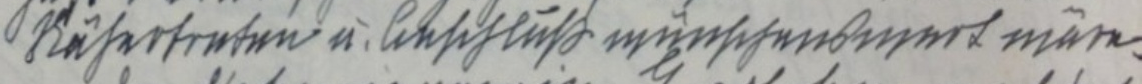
Nähertreten u. Anschluß wünschenswert wäre.
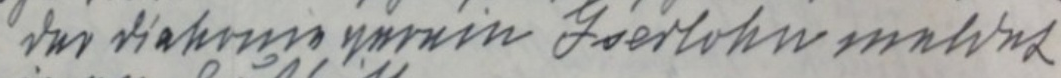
Der Diakonieverein Iserlohn meldet
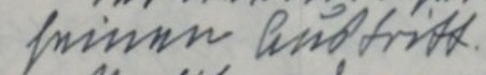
seinen Austritt.
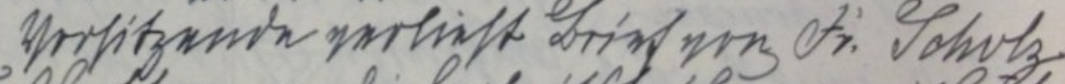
Vorsitzede verliest Brief von Fr. Schulz
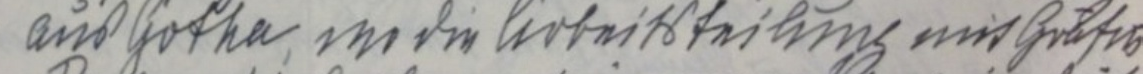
aus Gotha, wo die Arbeitsteilung mit Gräfin
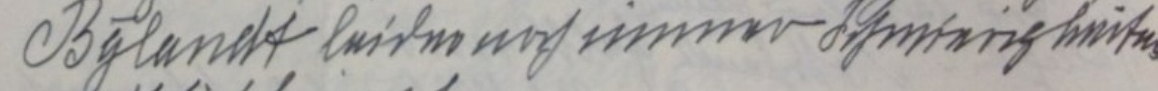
Bylandt leider noch immer Schwierigkeiten
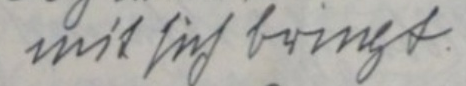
mit sich bringt.
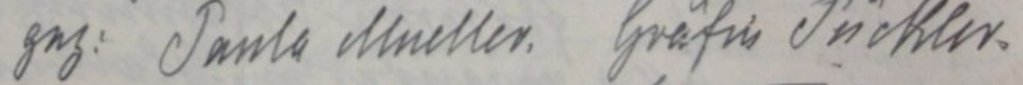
gez: Paula Mueller Gräfin Pückler
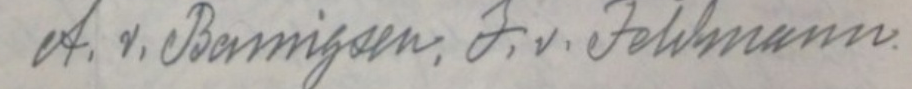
A. v. Bennigsen, F. v. Feldmann
